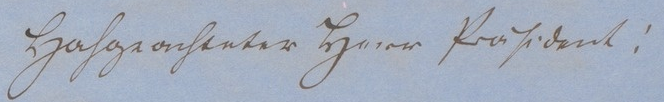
Hochgeachteter Herr Präsident!
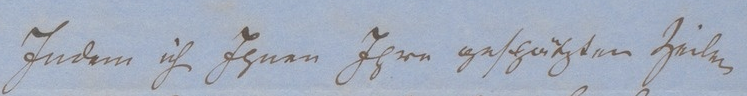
Indem ich Ihnen Ihre geschätzten Zeilen
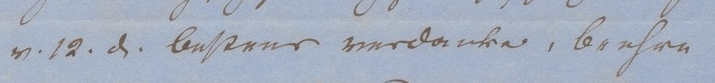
v. 12. d. bestens verdanke, beehre
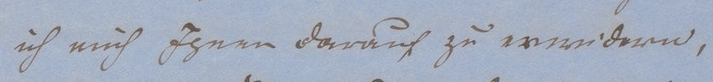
ich mich Ihnen darauf zu erwidern,
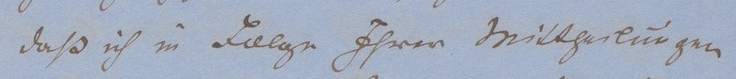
daß ich in Folge Ihrer Mittheilungen
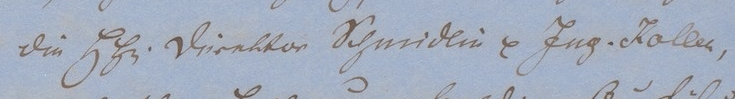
die HHr. Direktor Schmidlin & Ing. Koller,
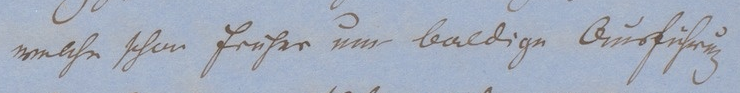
welche schon früher um baldige Ausführung
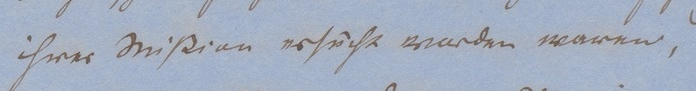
ihrer Mißion ersucht worden waren,
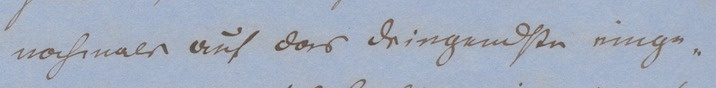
nochmals auf das Dringendste einge-
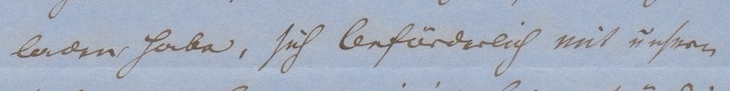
laden habe, sich beförderlich mit unsern
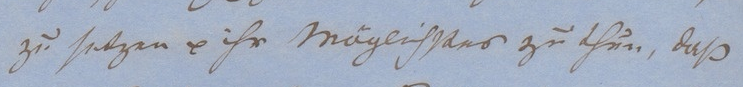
zu setzen & ihr Möglichstes zu thun, daß
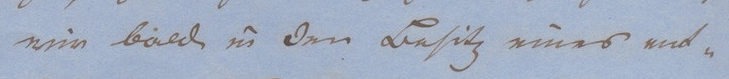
wir bald in den Besitz eines ent-
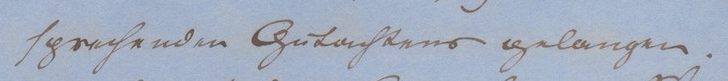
sprechenden Gutachtens gelangen.
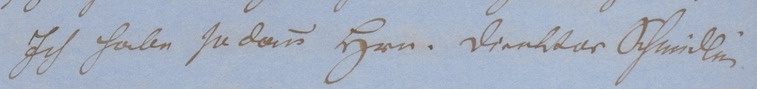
Ich habe so dann Hrn. Direktor Schmidlin
